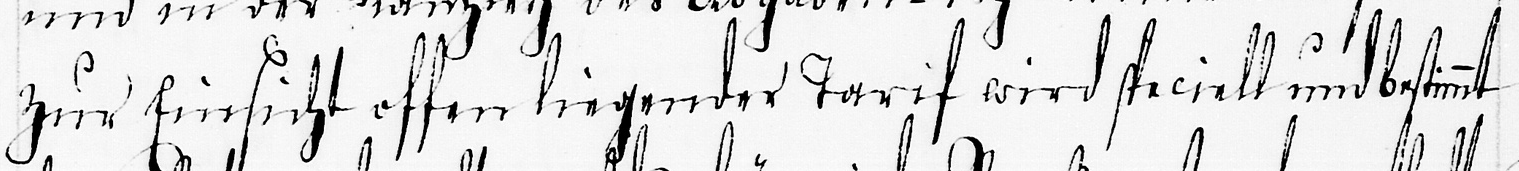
zur Einsicht offen liegender Tarif wird speciell und best¬
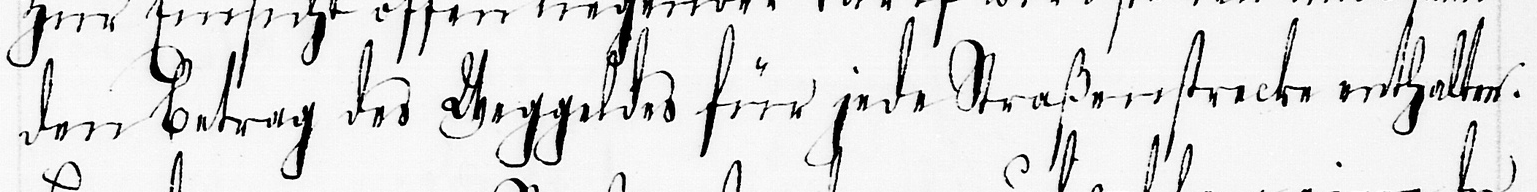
den Betrag des Weggeldes für jede Straßenstrecke enthalten.
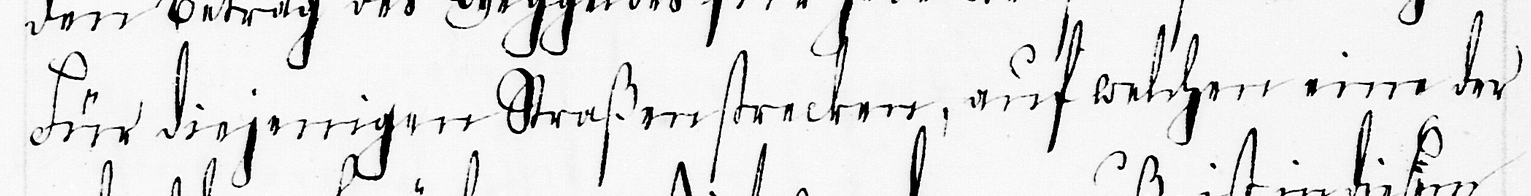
Für diejenigen Straßenstrecken, auf welchen eine der
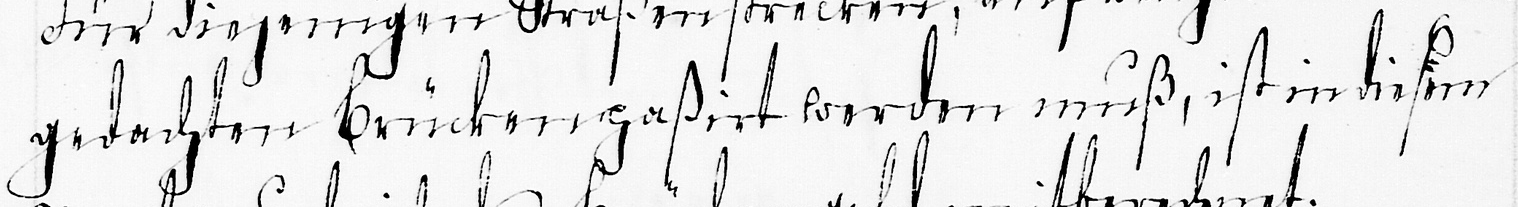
gedachten Brücken paßirt werden muß, ist in diesem
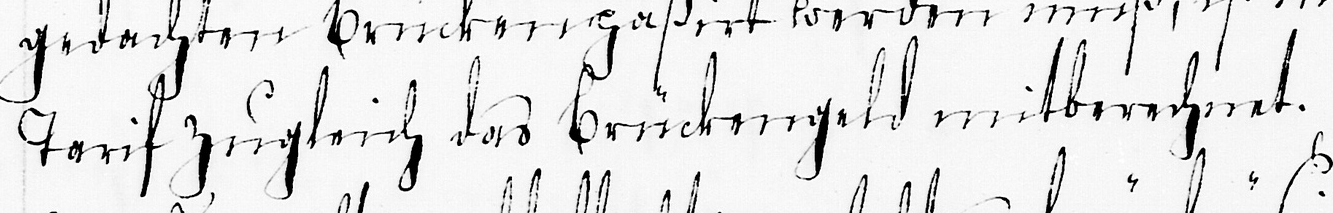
Tarif zugleich das Brückengeld mitberechnet.
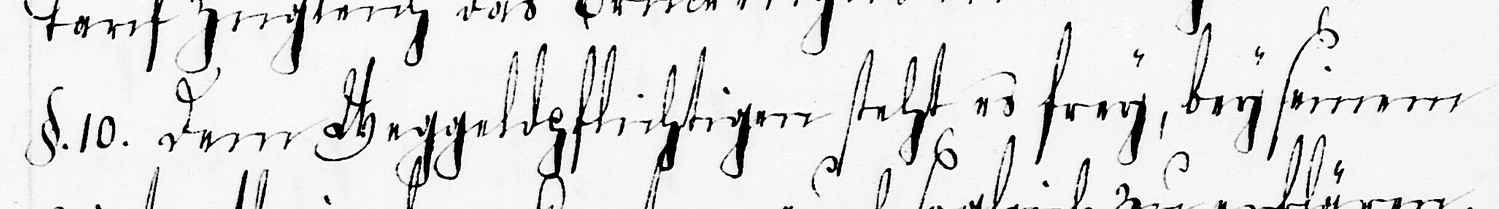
§. 10. Dem Weggeldpflichtigen steht es frey, bey seinem
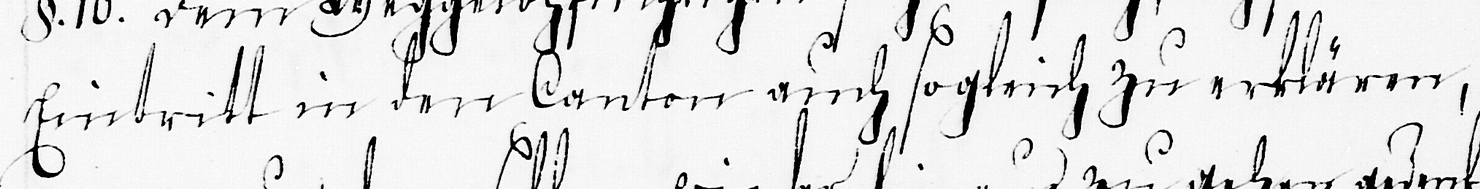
Eintritt in den Canton auch sogleich zu erklären,
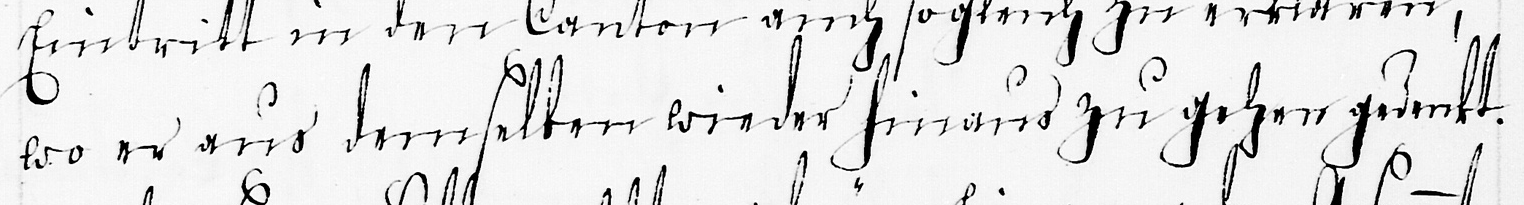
wo er aus demselben wieder hinaus zu gehen gedenkt.
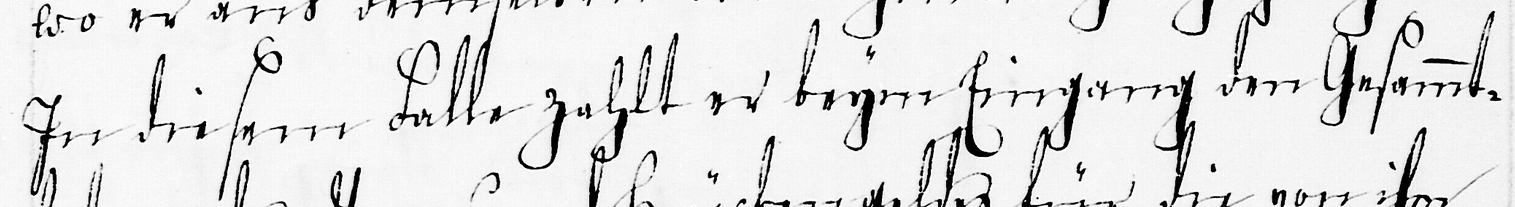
In diesem Falle zahlt er beym Eingang den Gesammt¬
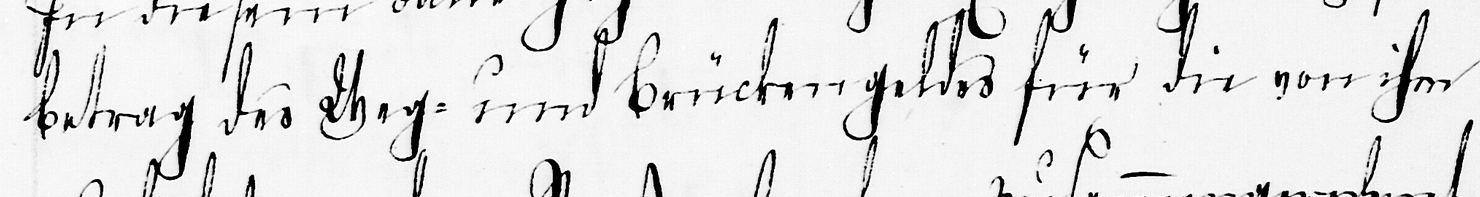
betrag des Weg- und Brückengeldes für die von ihm
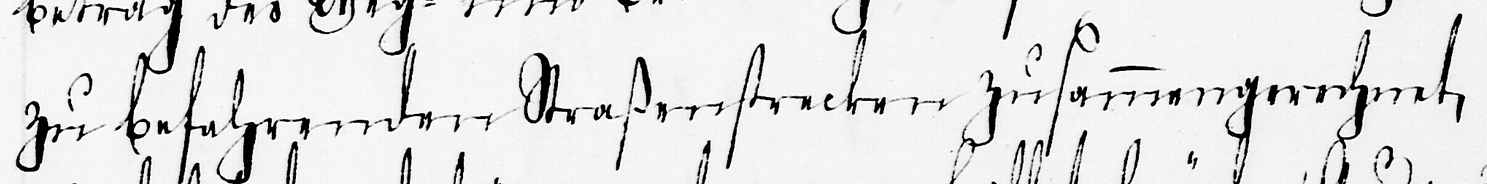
zu befahrenden Straßenstrecken zusammengerechnet,
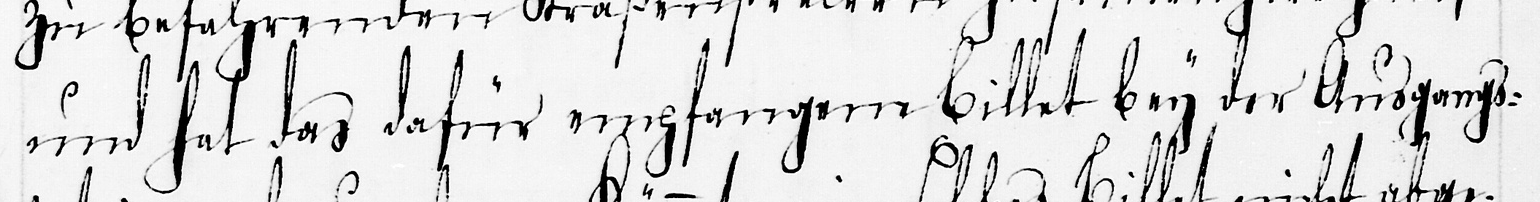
und hat das dafür empfangene Billet bey der Ausgangs¬
